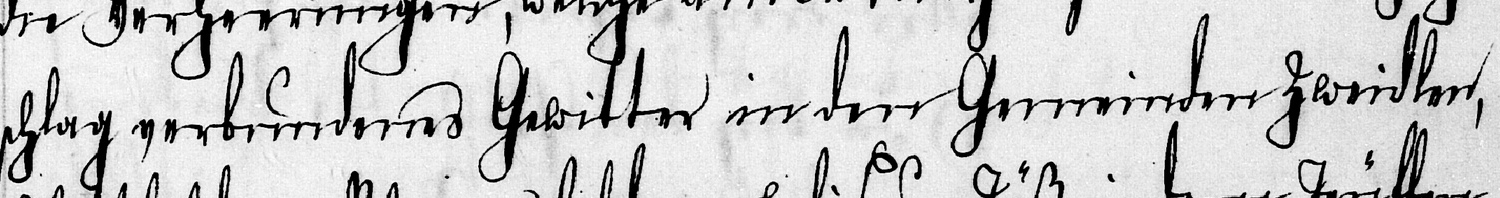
hlag verbundenes Gewitter in den Gemeinden Zweidlen,
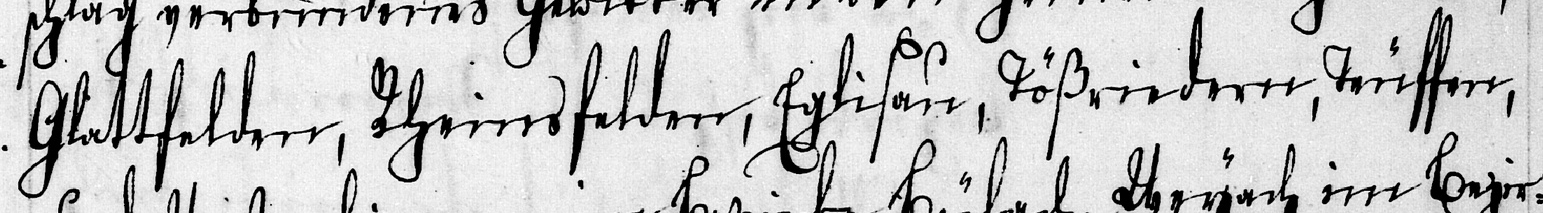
Glattfelden, Rheinsfelden, Eglisau, Tößriedern, Teuffen,
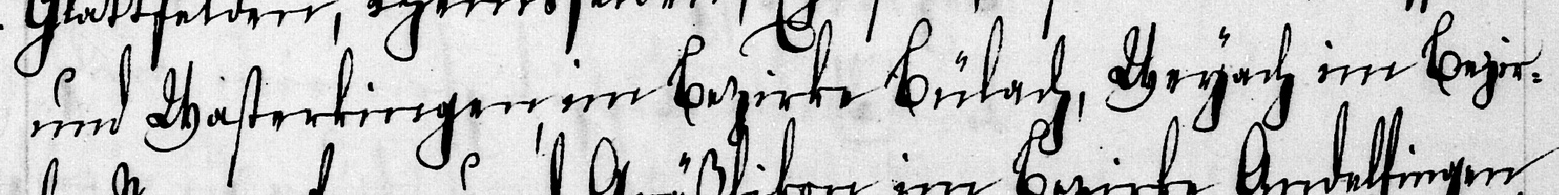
und Wasterkingen, im Bezirke Bülach, Weyach im Bezir¬
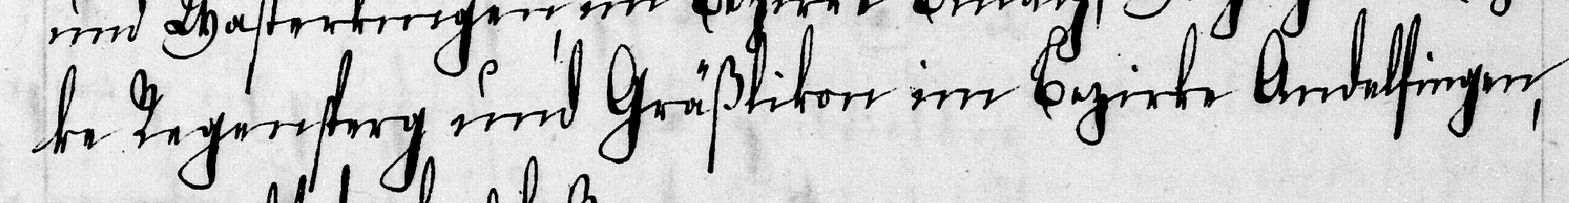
ke Regenspberg und Gräßlikon im Bezirke Andelfingen,
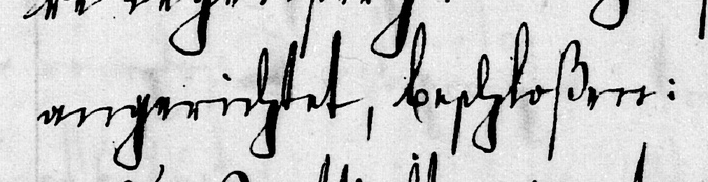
angerichtet, beschloßen:
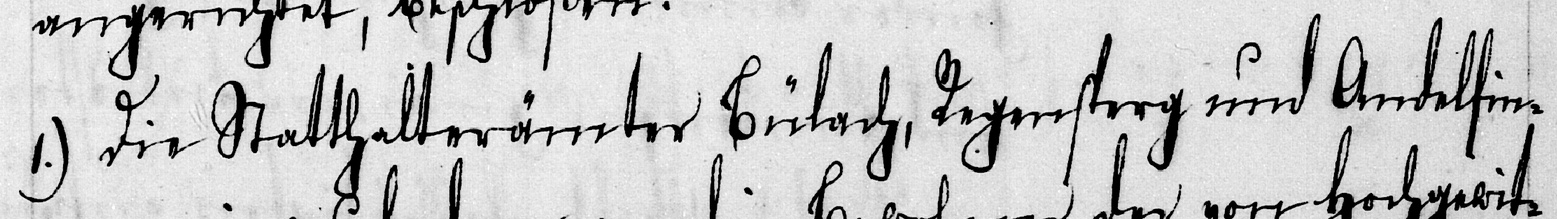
1.) Die Statthalterämter Bülach, Regensperg und Andelfin¬
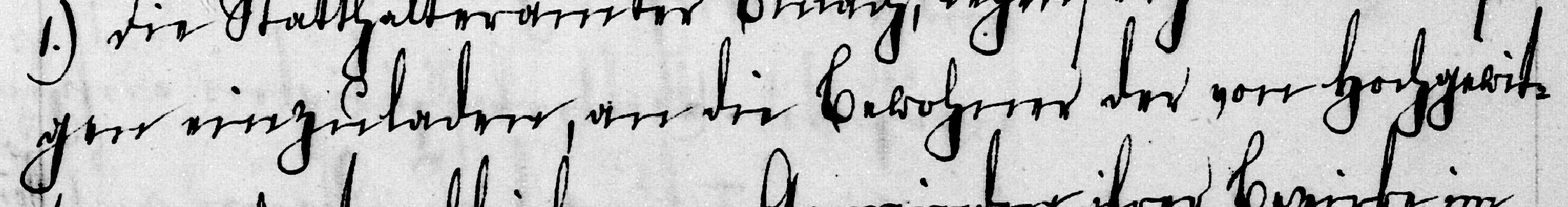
gen einzuladen, an die Bewohner der von Hochgewit¬
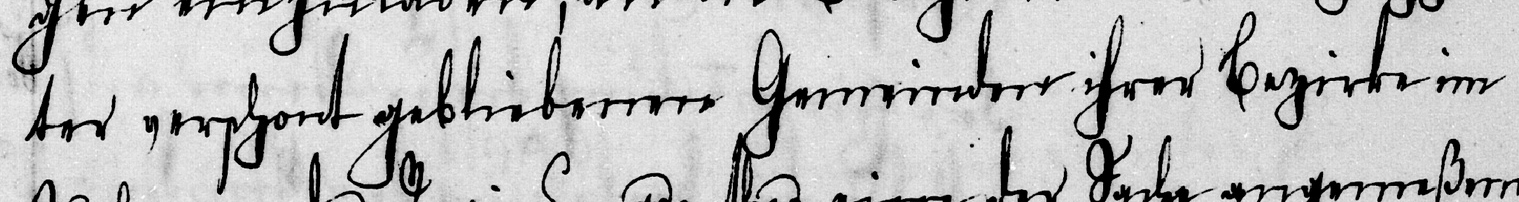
ter verschont gebliebenen Gemeinden ihrer Bezirke im
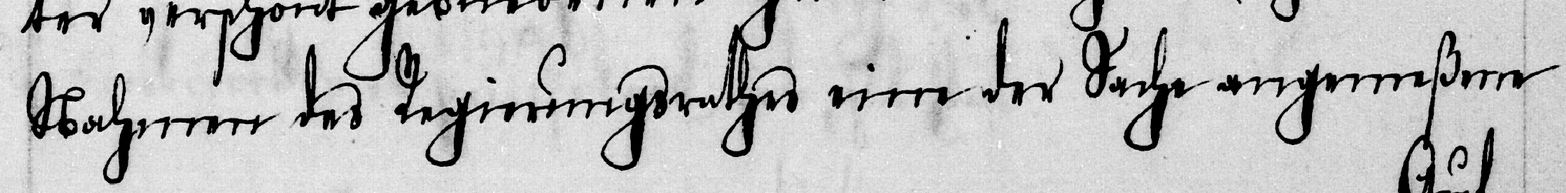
Nahmen des Regierungsrathes eine der Sache angemeßene
